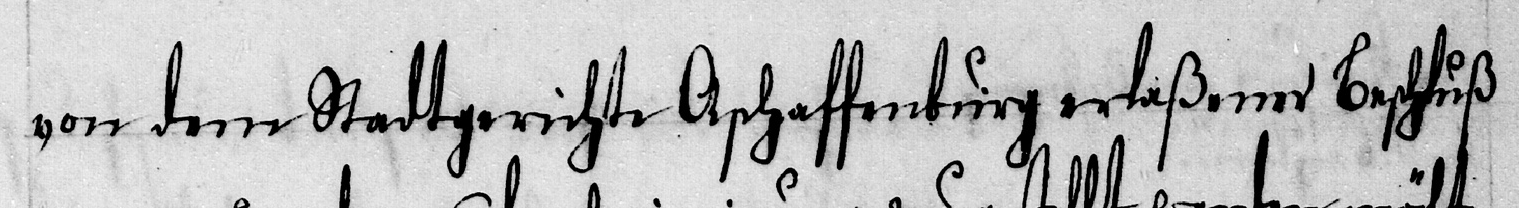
von dem Stadtgerichte Aschaffenburg erlaßener Beschluß
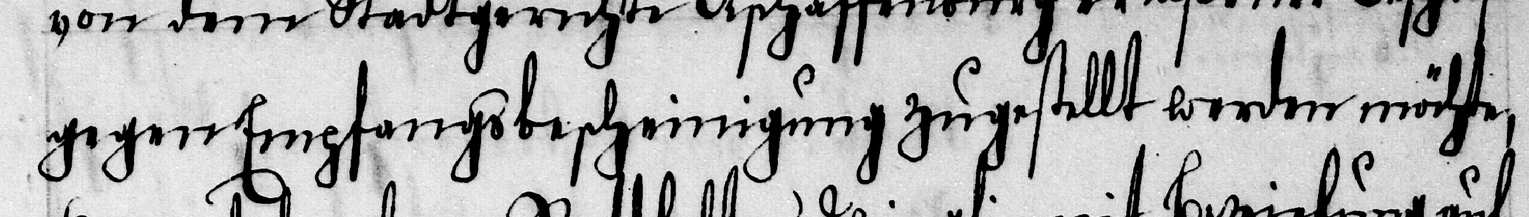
gegen Empfangsbescheinigung zugestellt werden möchte,
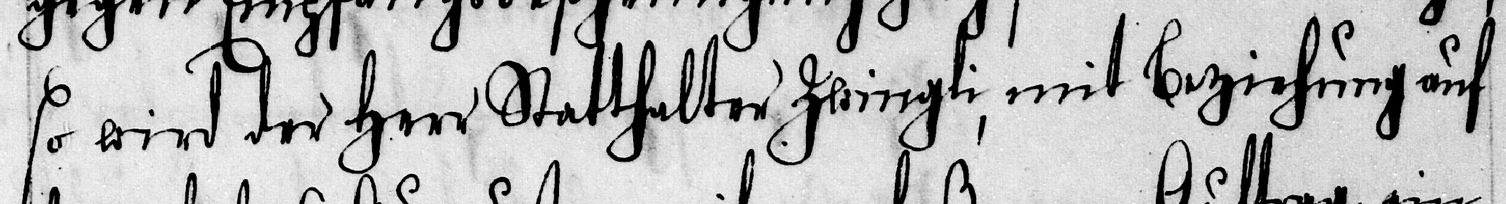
so wird der Herr Statthalter Zwingli, mit Beziehung auf
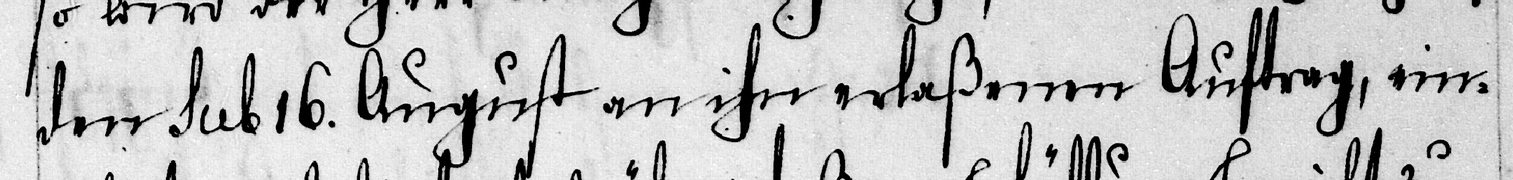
den Sub 16. August an ihn erlaßenen Auftrag, ein¬
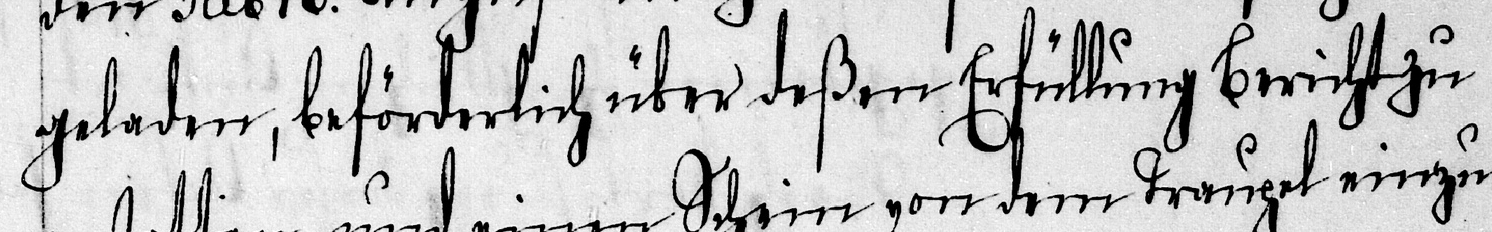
geladen, beförderlich über deßen Erfüllung Bericht zu
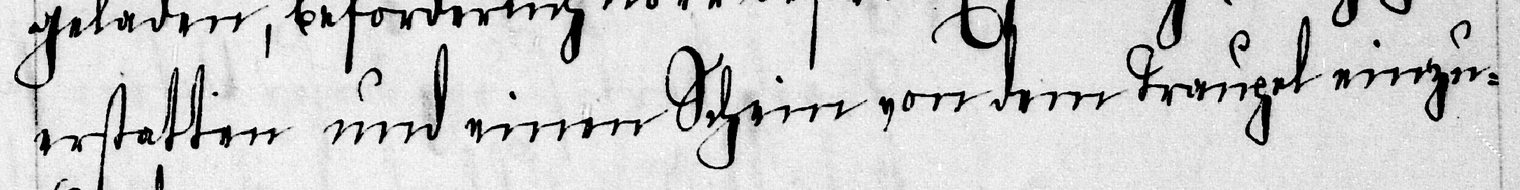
erstatten und einen Schein von dem Traupel einzu¬
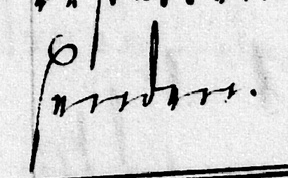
senden.
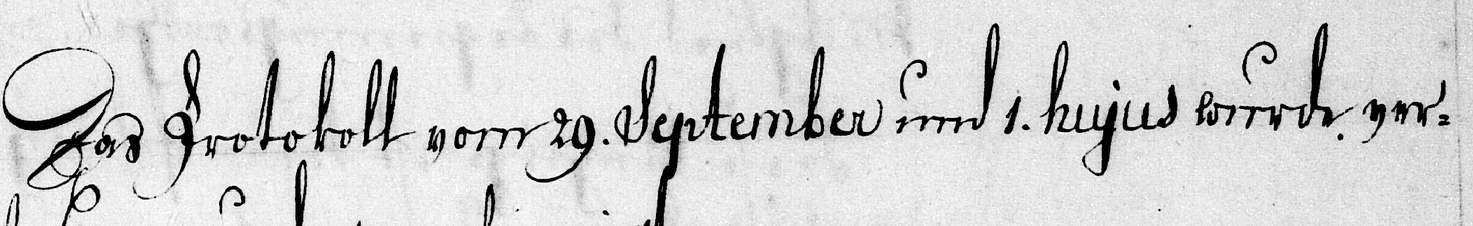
Das Protokoll vom 29. September und 1. hujus wurde ver¬
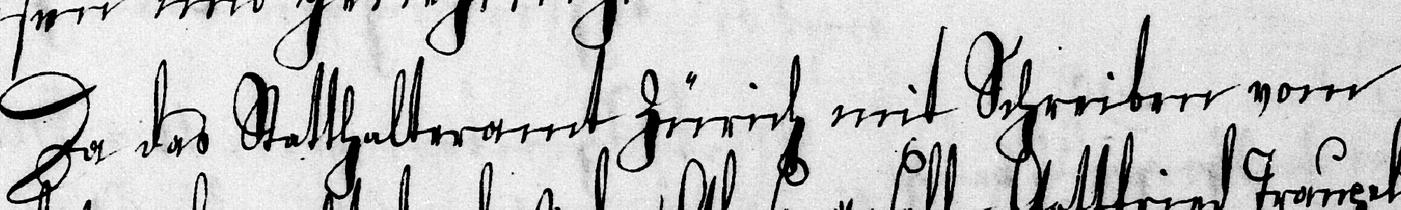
Da das Statthalteramt Zürich mit Schreiben vom
